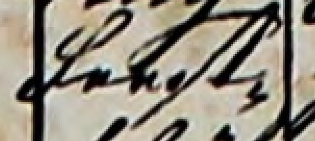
Seest„
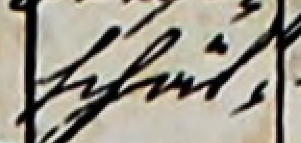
eschät„
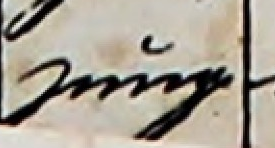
zung
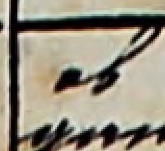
ob
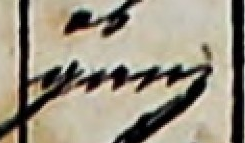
ganz
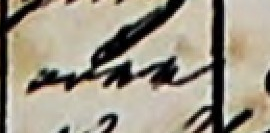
wer
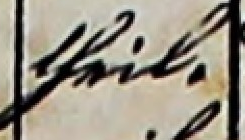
theil.
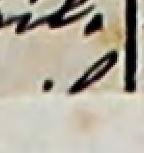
weise
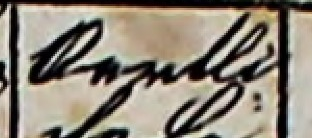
Oertli„
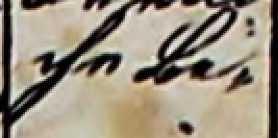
che Be
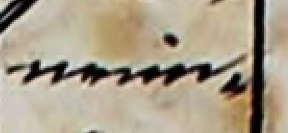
n???„
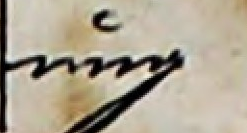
ung
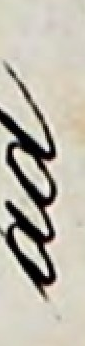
ad
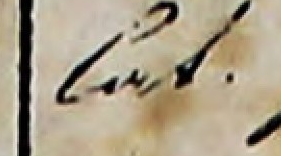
Cat.
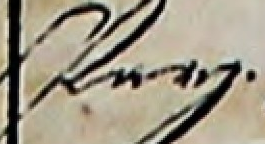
Perg.
